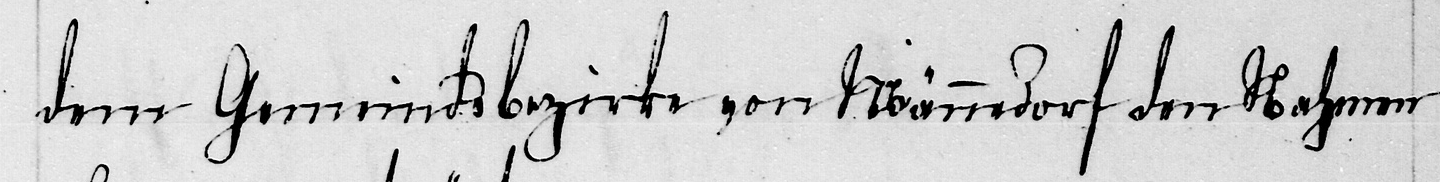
dem Gemeindsbezirke von Männedorf den Nahmen
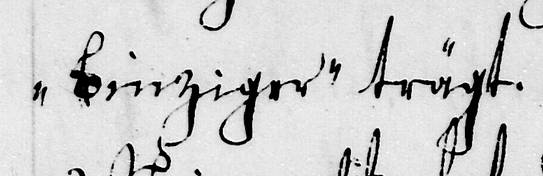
„Binziger“ trägt.
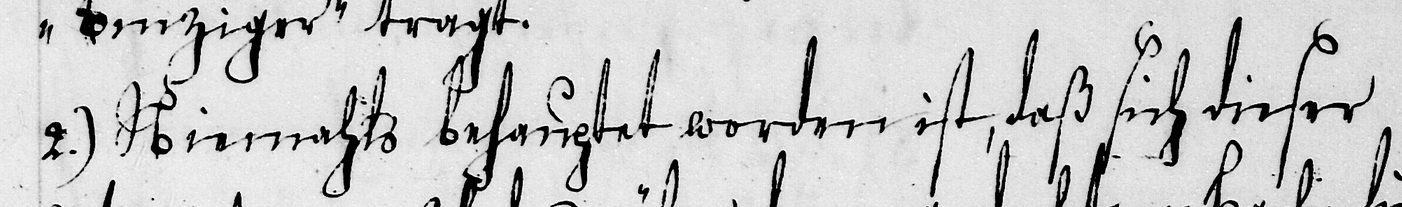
2.) Niemahls behauptet worden ist, daß sich dieser
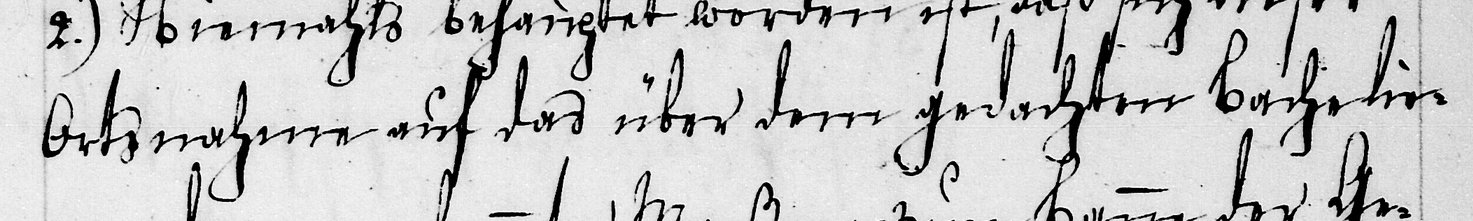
Ortsnahme auf das über dem gedachten Bache lie¬
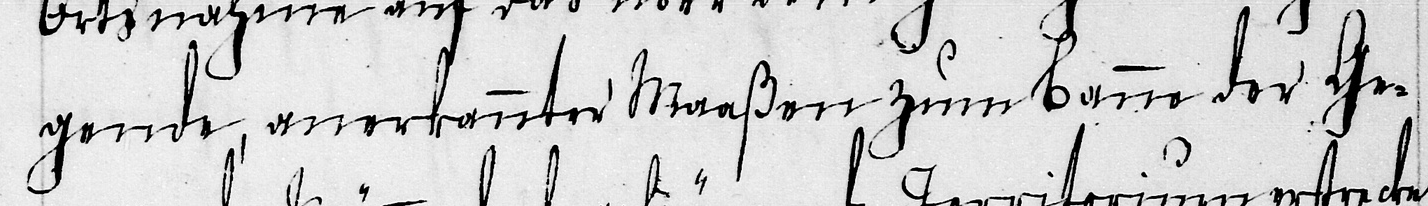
gende, anerkannter Maaßen zum Banne der Ge¬
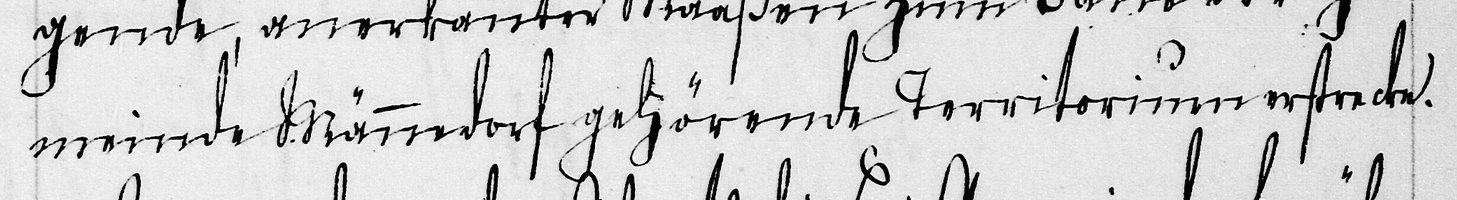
meinde Männedorf gehörende Territorium erstrecke.
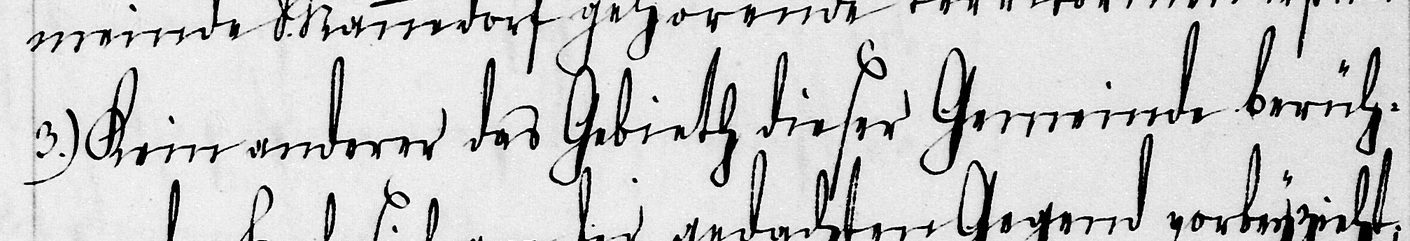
3.) Kein anderer das Gebieth dieser Gemeinde berüh¬
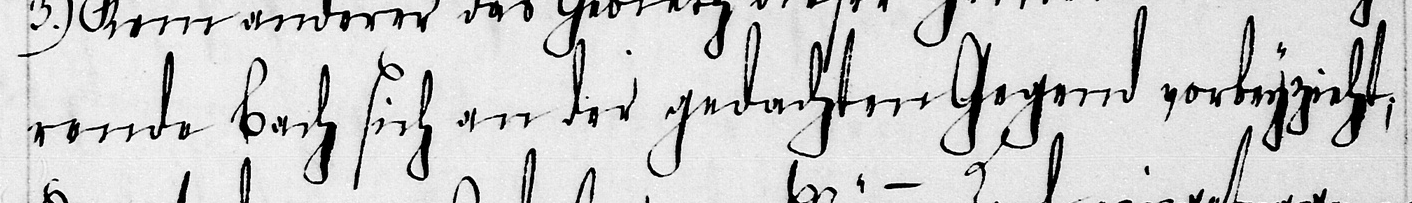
rende Bach sich an der gedachten Gegend vorbeyzieht;
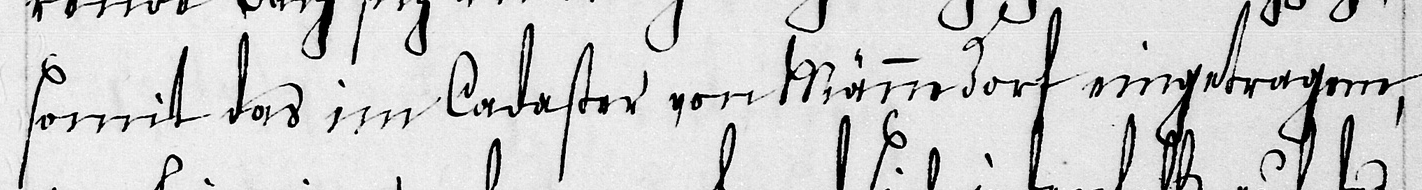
somit das im Cadaster von Männedorf eingetragene,
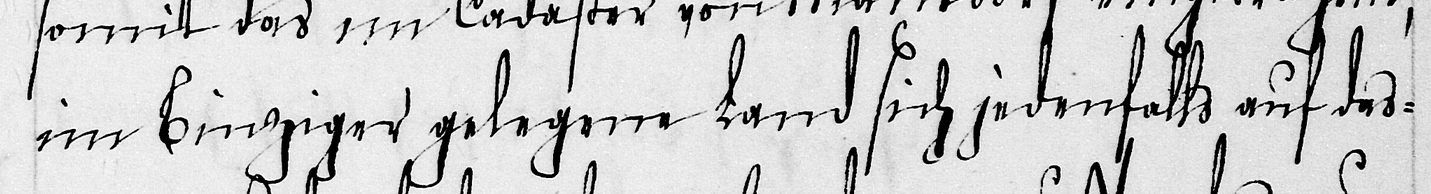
im Binziger gelegene Land sich jedenfalls auf das¬
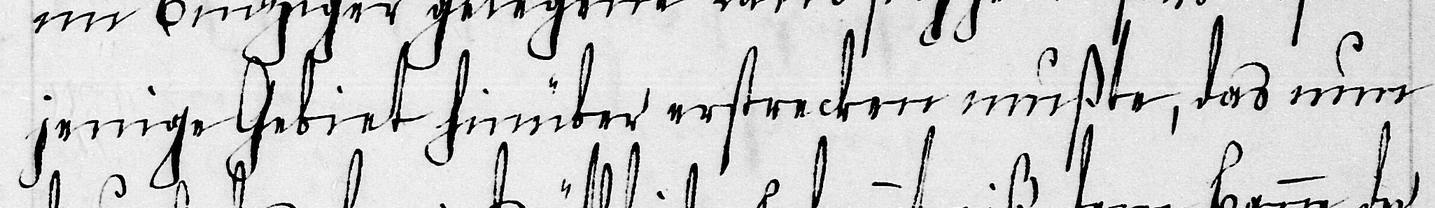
jenige Gebiet hinüber erstrecken mußte, das nun
